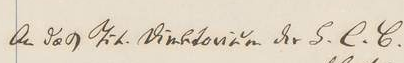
An das Tit. Direktorium der S.C.B.
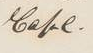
Basel.
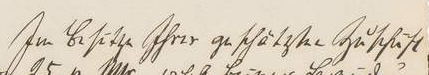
Im Besitze Ihrer geschätzten Zuschrift
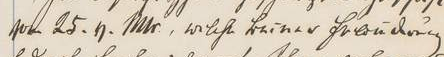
vom 25. v. Mts., welche keiner Erwiederung
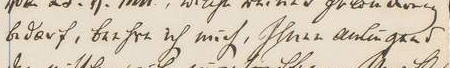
bedarf, beehre ich mich, Ihnen anliegend
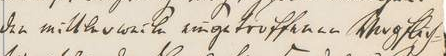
den mittlerweile eingetroffenen Verpflich-
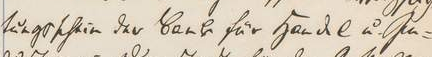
tungsschein der Bank für Handel u. In-
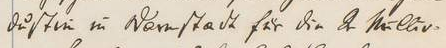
dustrie in Darmstadt für die 2 Millio-
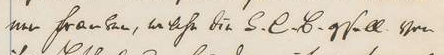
nen Franken, welche die S.C.B.gsell. von
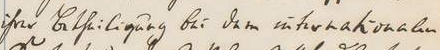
ihrer Betheiligung bei dem internationalen
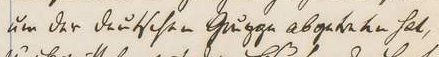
um der deutschen Gruppe abgetreten hat,
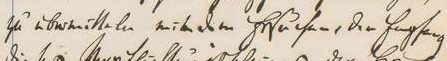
zu übermitteln mit dem Ersuchen, den Empfang
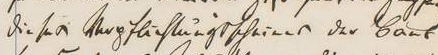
dieses Verpflichtungsscheines der Bank
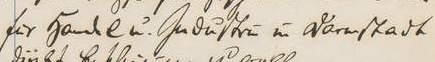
für Handel u. Industrie in Darmstadt
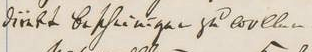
direkt bescheinigen zu wollen.
